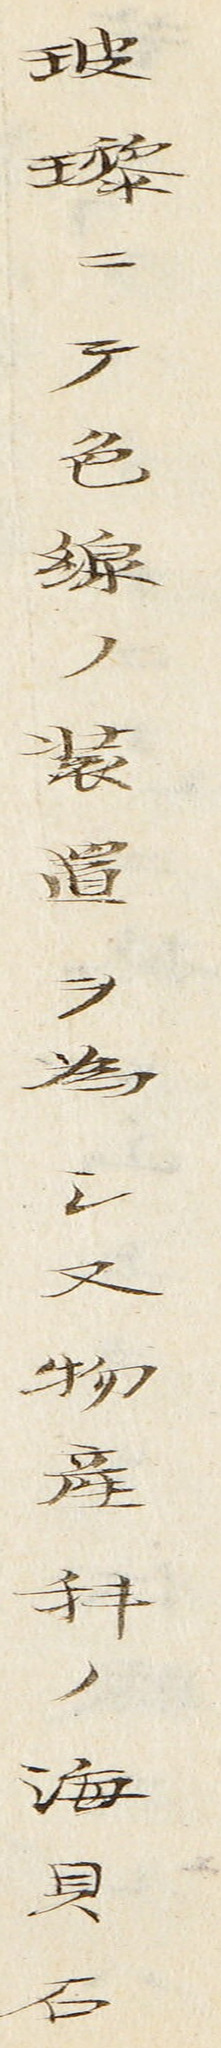玻瓈ニテ色線ノ装置ヲ為シ又物産拝ノ海貝石
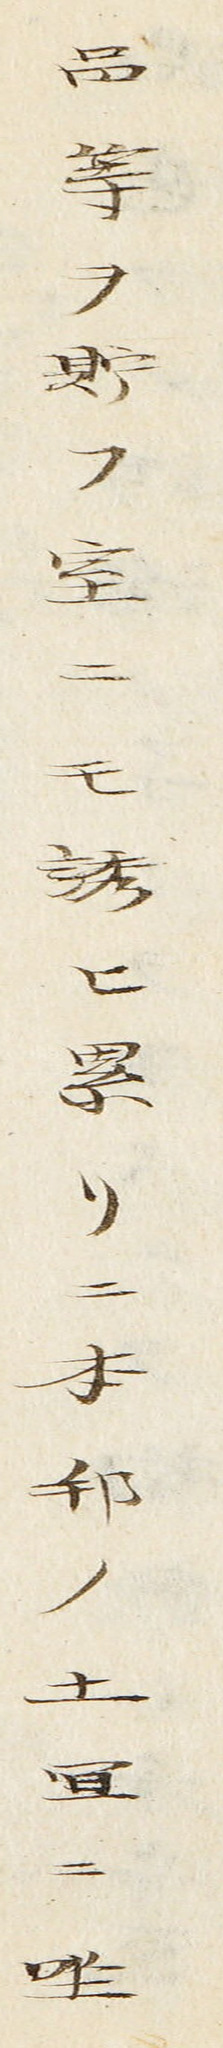品等ヲ貯フ室ニモ誘ヒ累リニ本邦ノ土冝ニ㘴
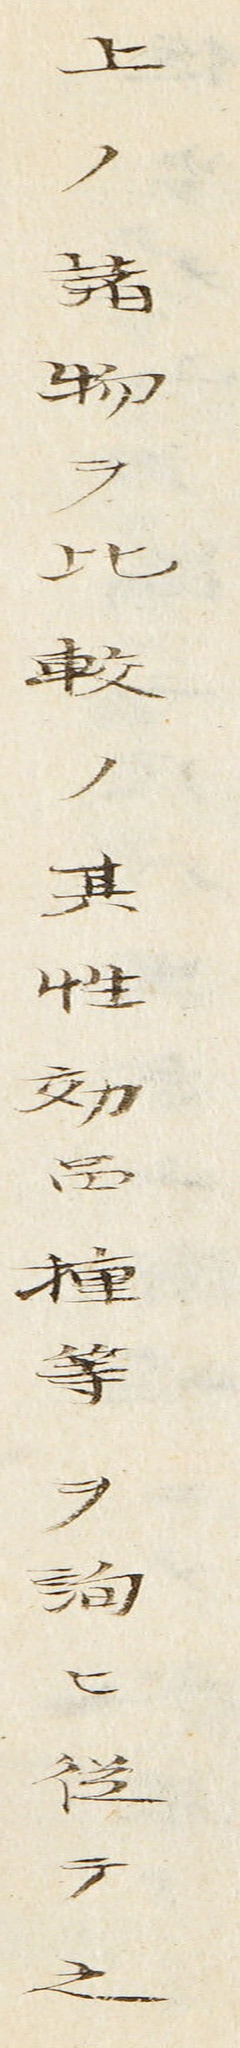上ノ諸物ヲ比較ノ其性効品種等ヲ詢ヒ従テ之
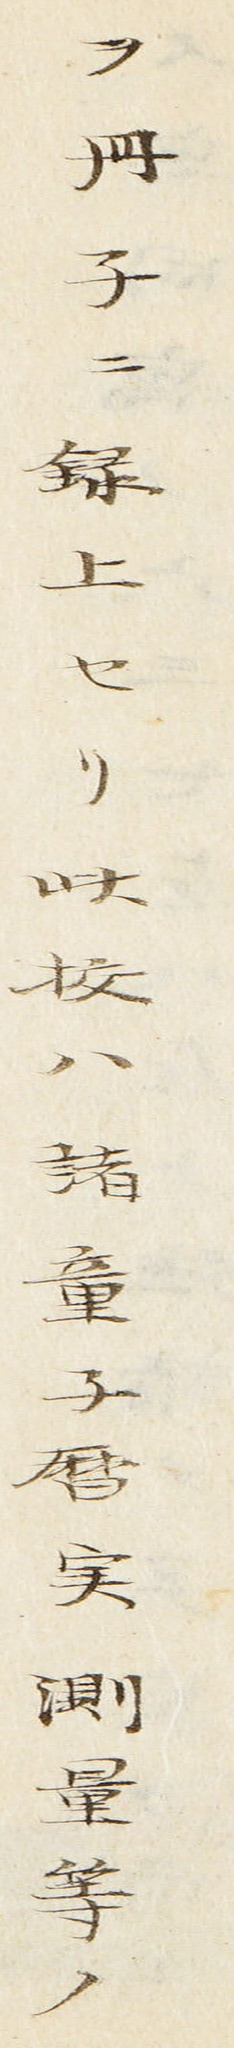ヲ冊子ニ録上セリ此校ハ諸童子暦実測量等ノ
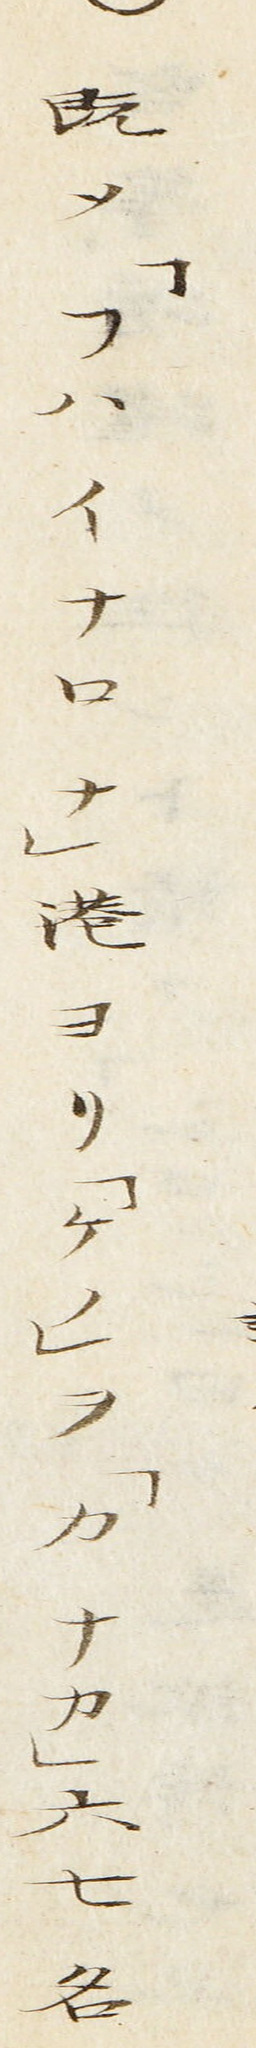○既シテ「フハイナロナ」港ヨリ「ケノ」ヲ「カナカ」六七名
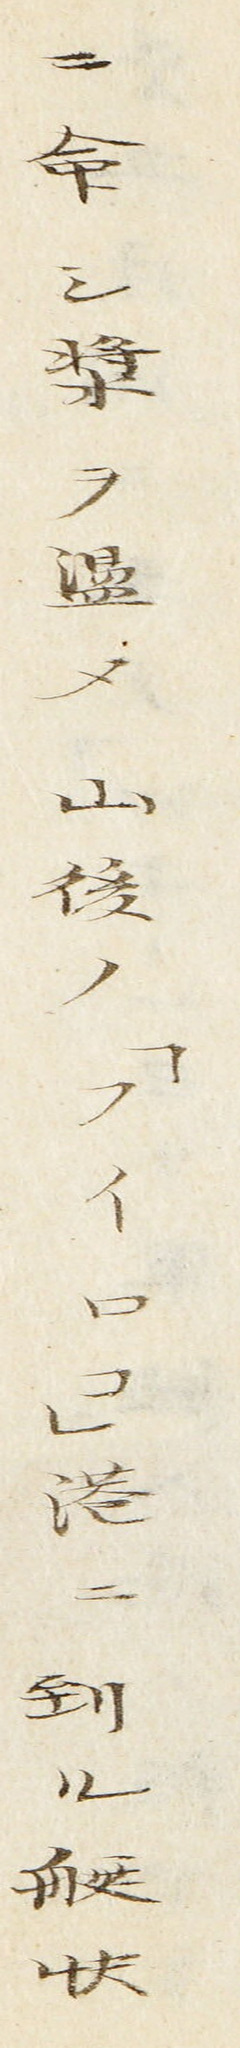ニ命シ漿ヲ盪シテ山後ノ「フイロコ」港ニ到ル艇快
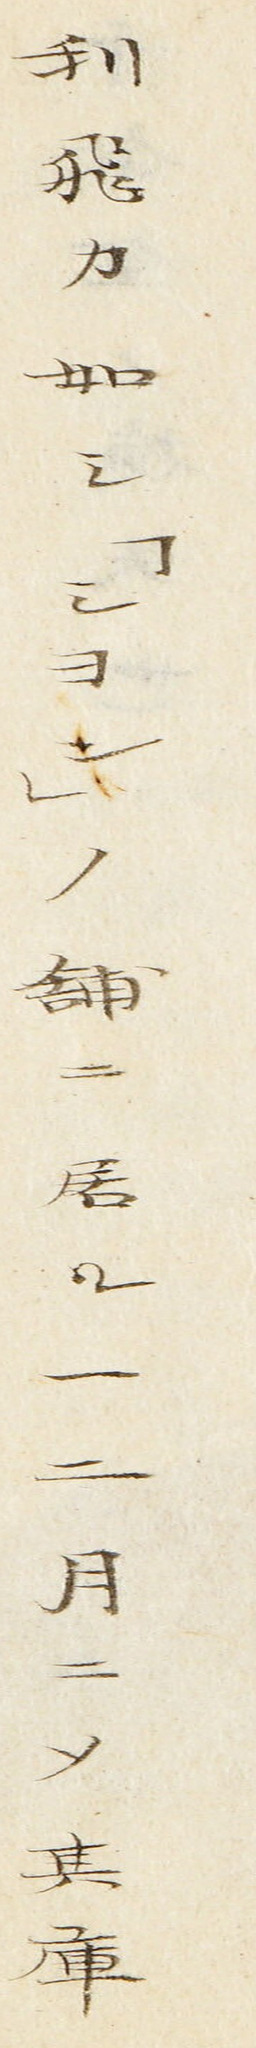利飛カ如シ「シヨン」ノ舗ニ居ル一二月ニシテ其庫
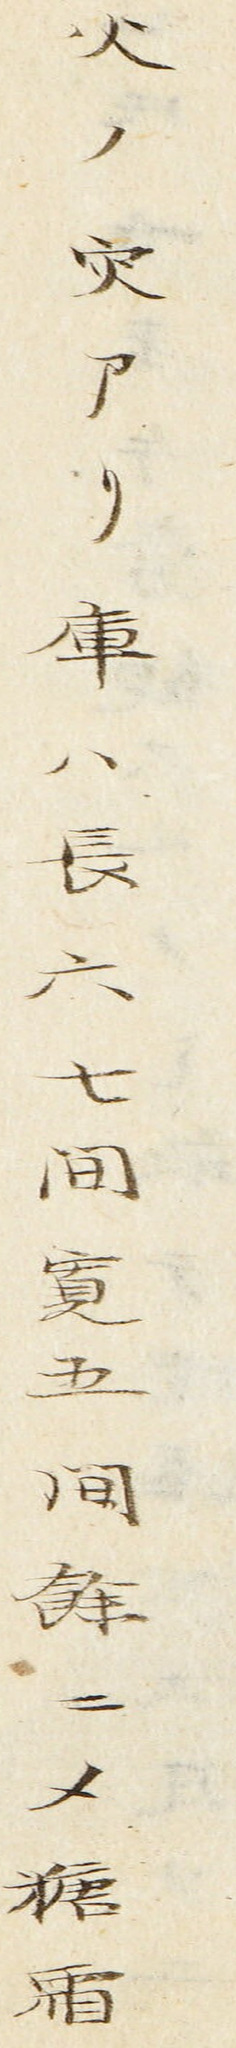火ノ灾アリ庫ハ長六七間寛五間余ニシテ糖霜
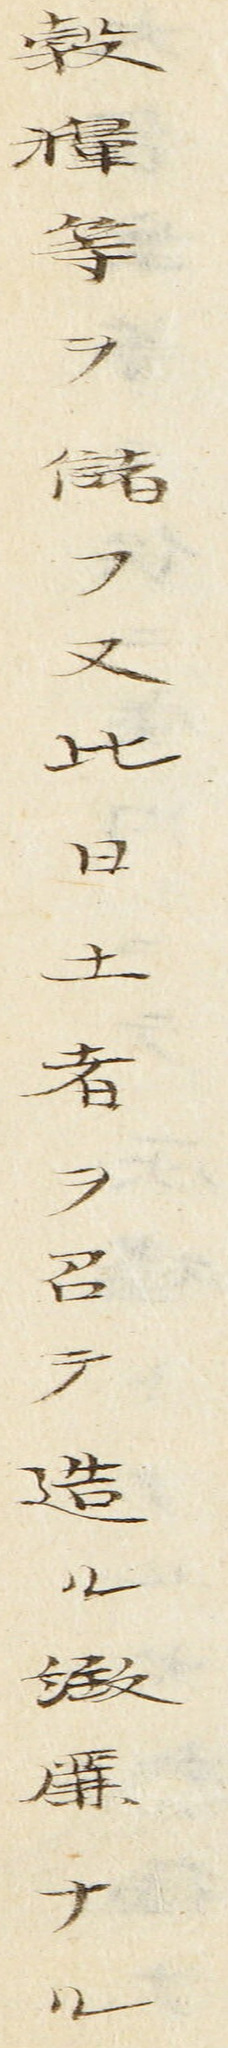穀糧等ヲ儲フ又比日土者ヲ召テ造ル緻麗ナル

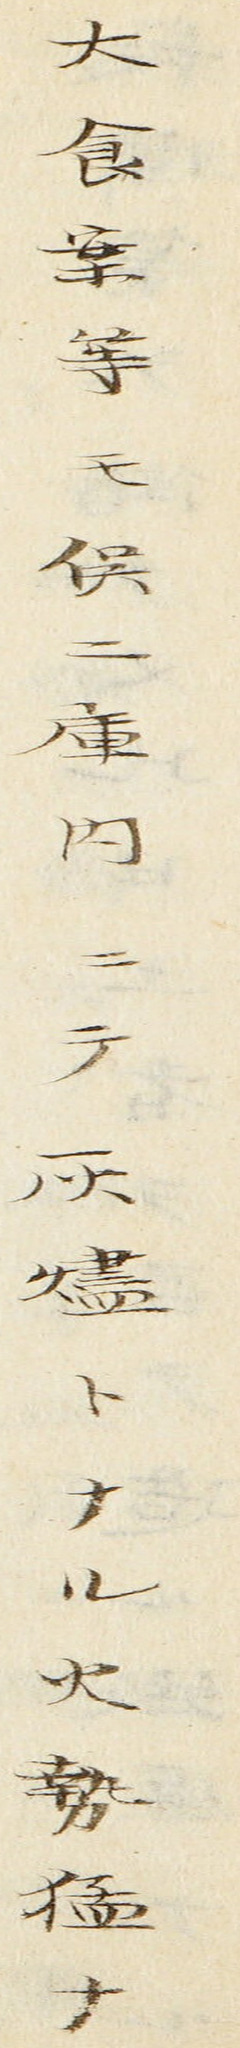大食案等モ俣ニ庫内ニテ灰燼トナル火勢猛ナ
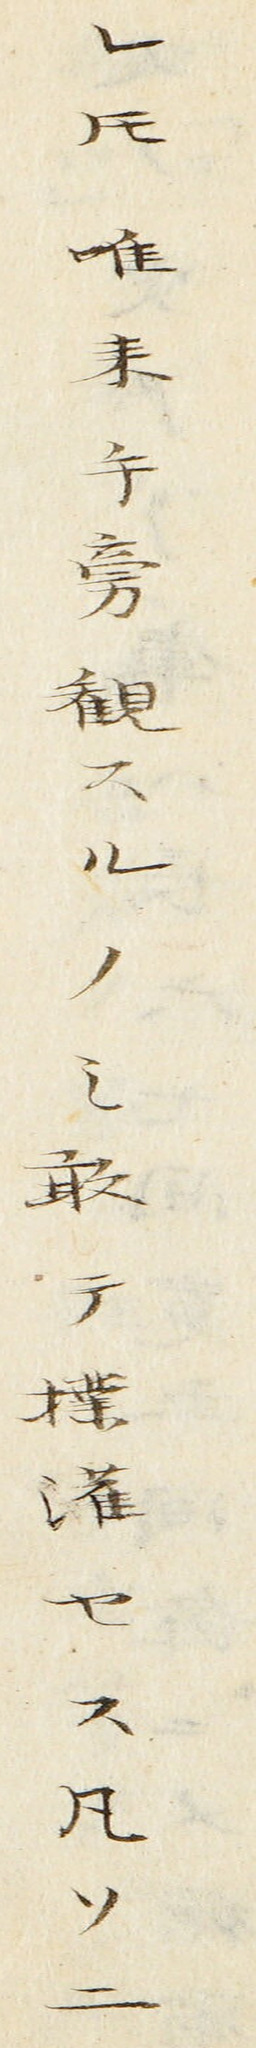レトモ唯来手旁観スルノミ敢テ撲灌セス凡ソ二
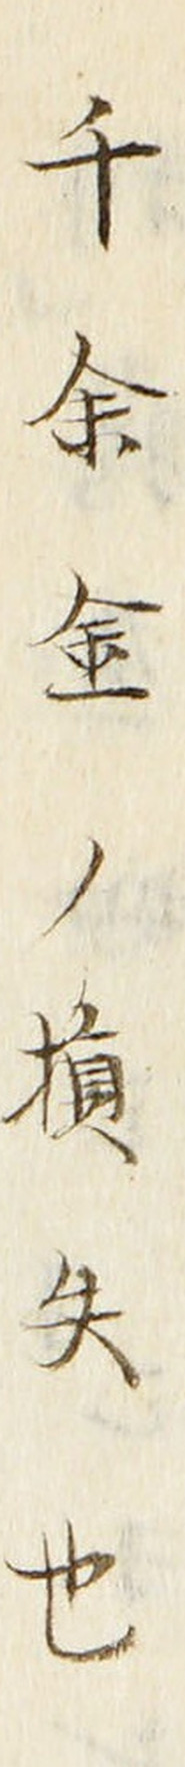千余金ノ損失也
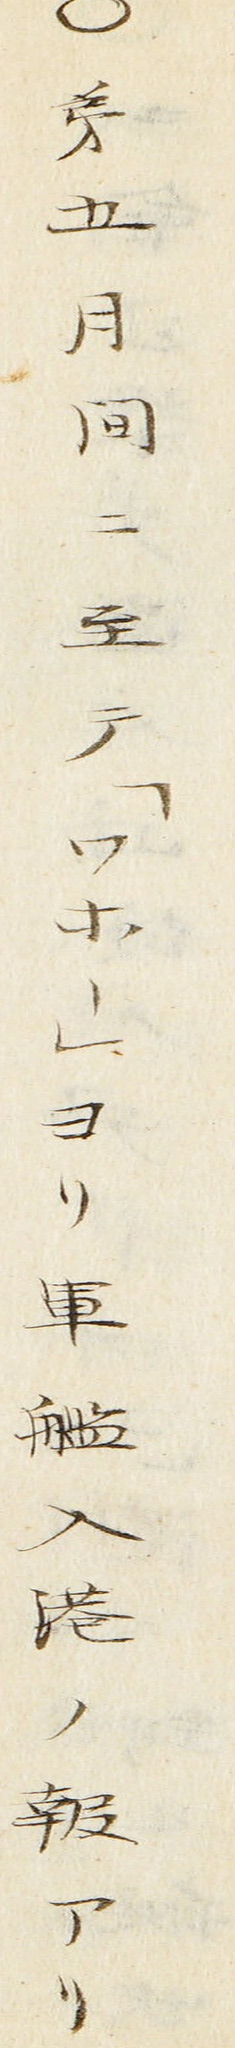○五月間ニ至テ「ワホー」ヨリ軍艦入港ノ報アリ
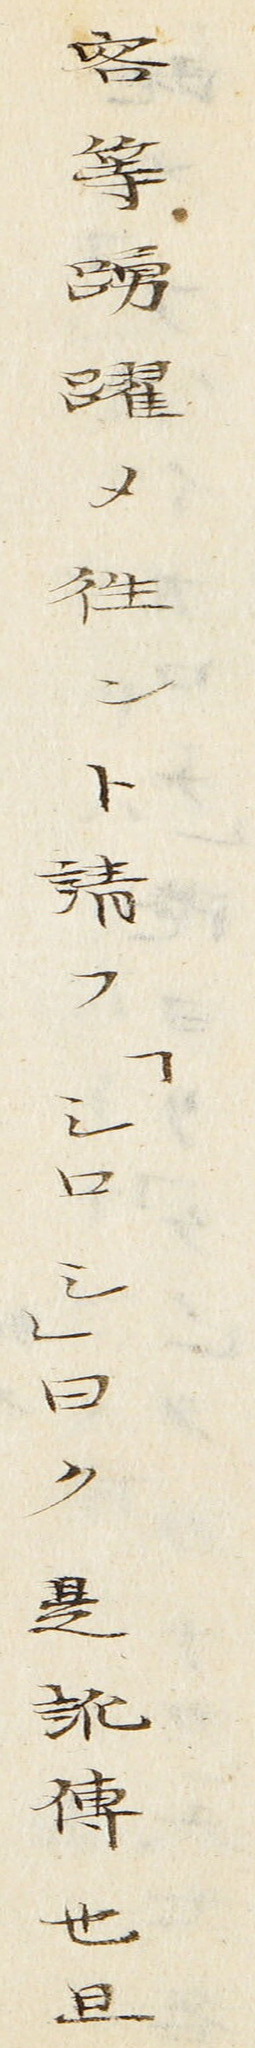客等踴躍シテ往ント請フ「シロシ」曰ク是訛伝也旦
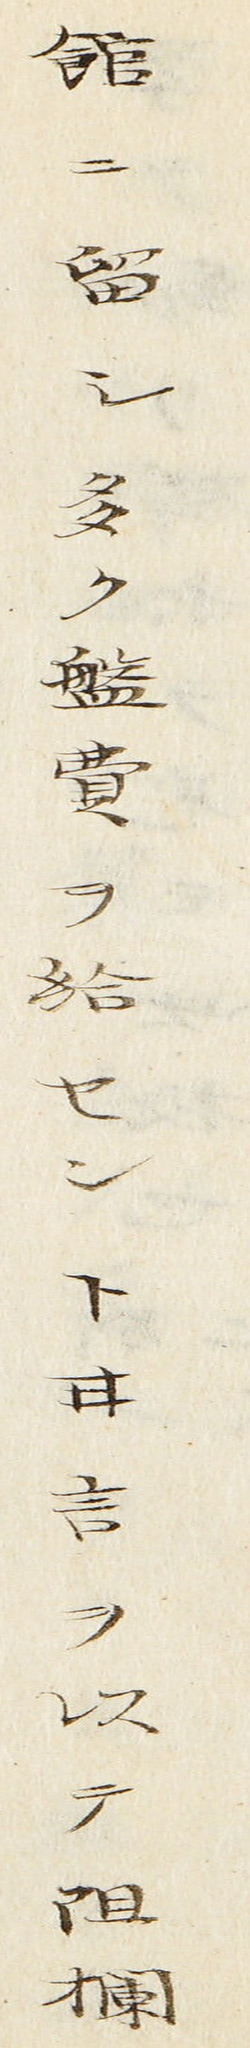館ニ留シ多ク盤費ヲ給セント甘言ヲ以テ阻欄
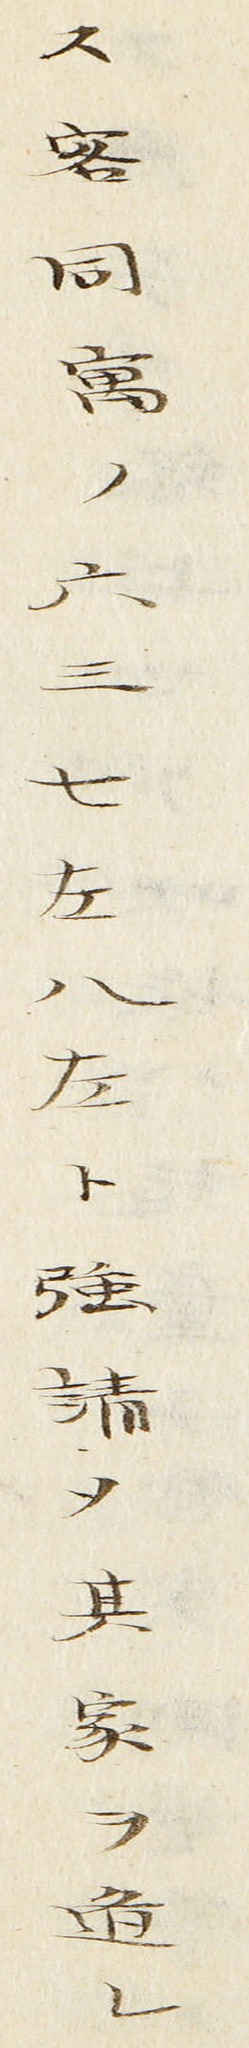ス客同寓ノ六三七左八左ト強請シテ其家ヲ遁レ
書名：流蕃通書
